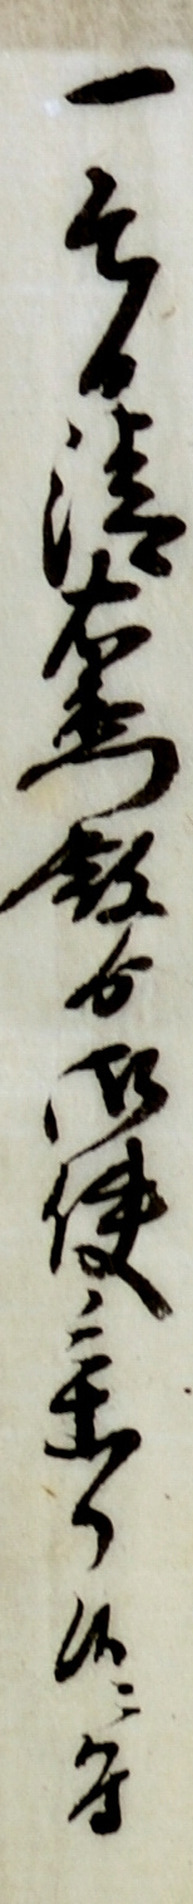一今日清右衛門殿より御使参り候ニ付

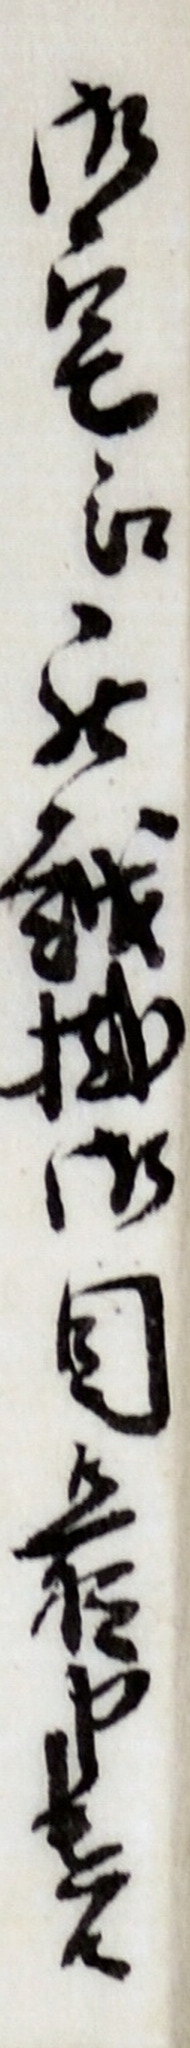御宅え罷越掛御目厳申遣候
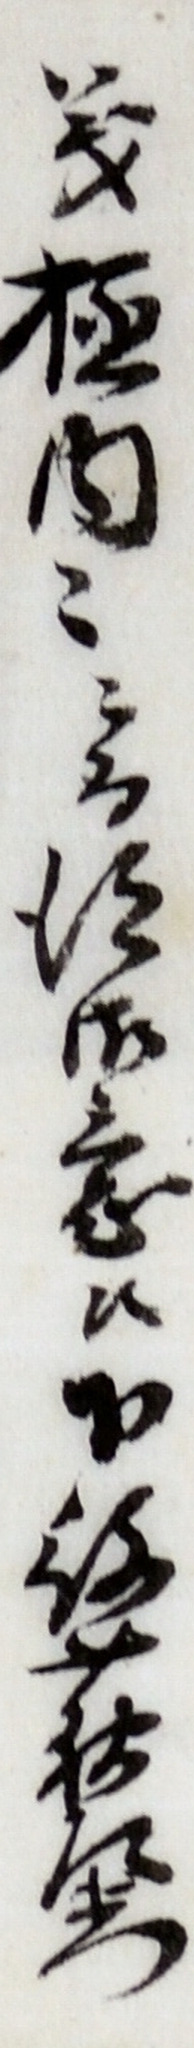義極内々にて得御意候下役萩左衛門
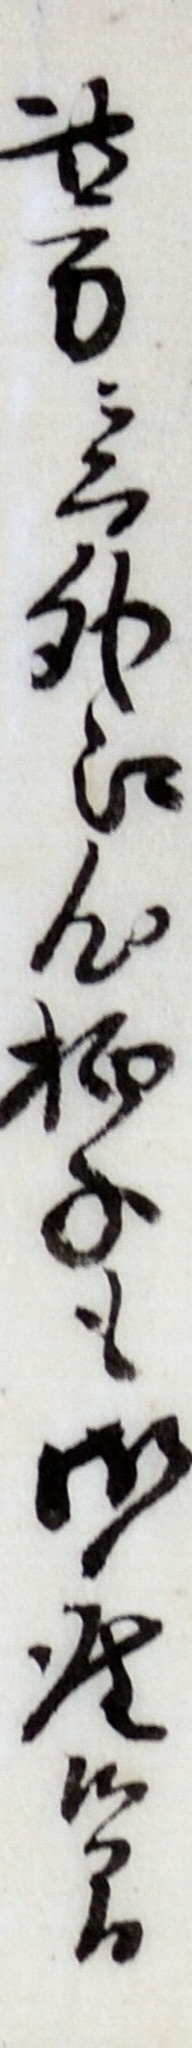此方にて外え心拍子も御座候間
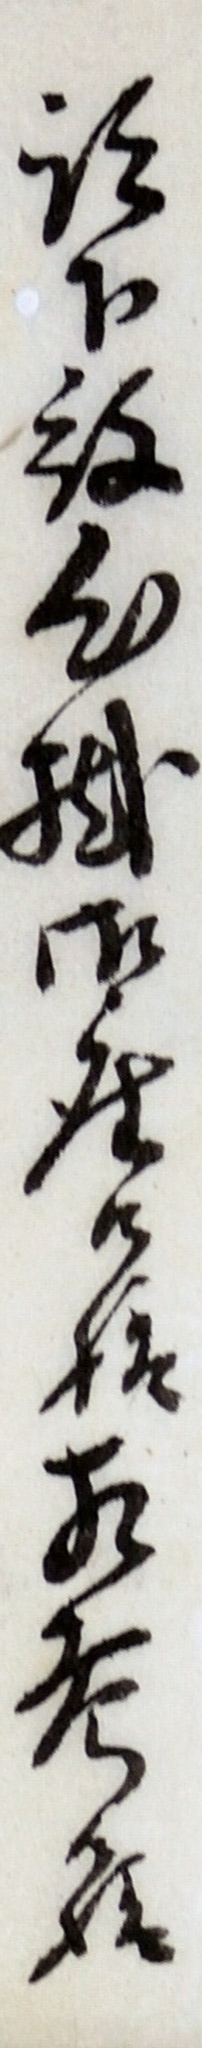跡下役心掛御座候様相考候様
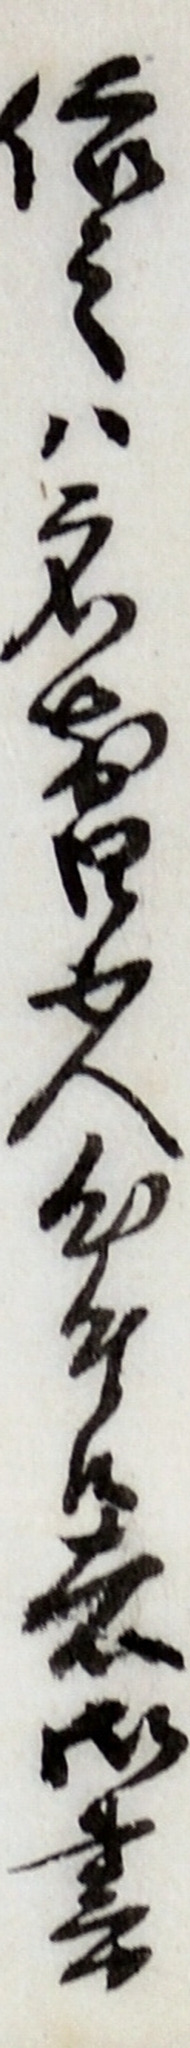依之は名前四五人心付候者御書
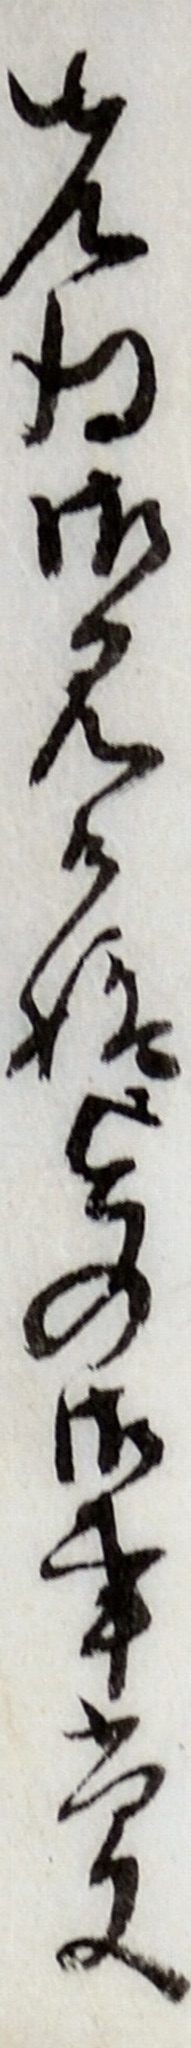先為御見候様にとの御事尚又
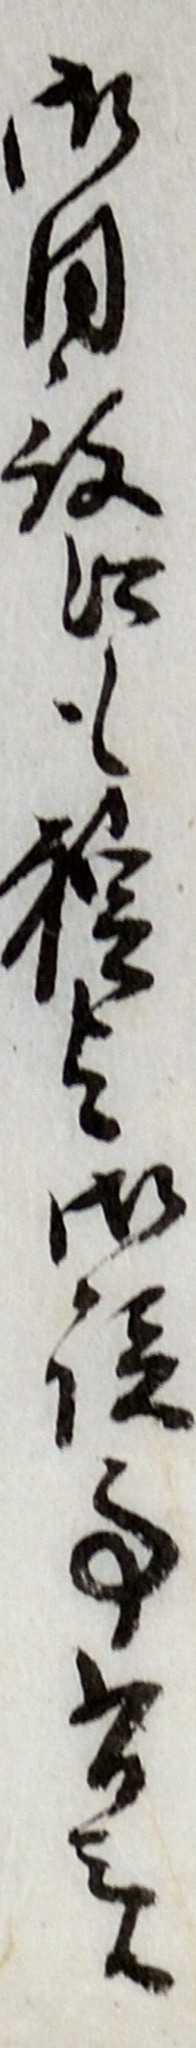御同役えも聢と御談事有之候
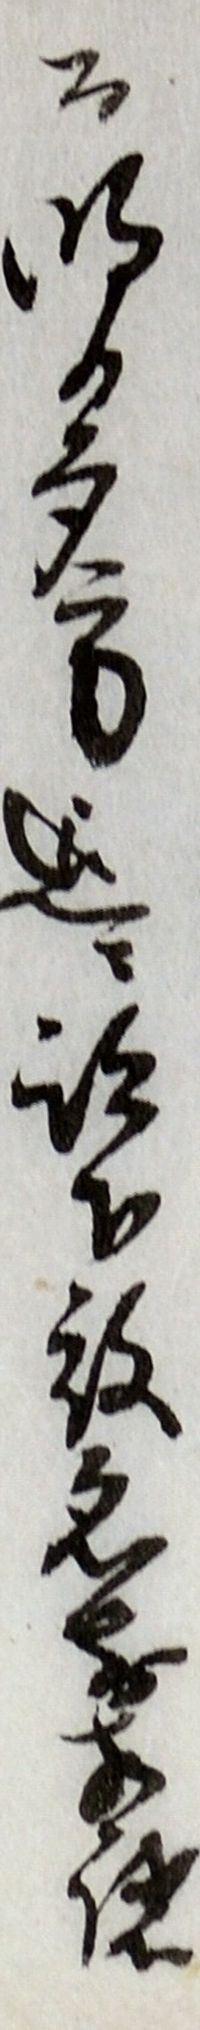而明日夕方迄に跡下役名前相認
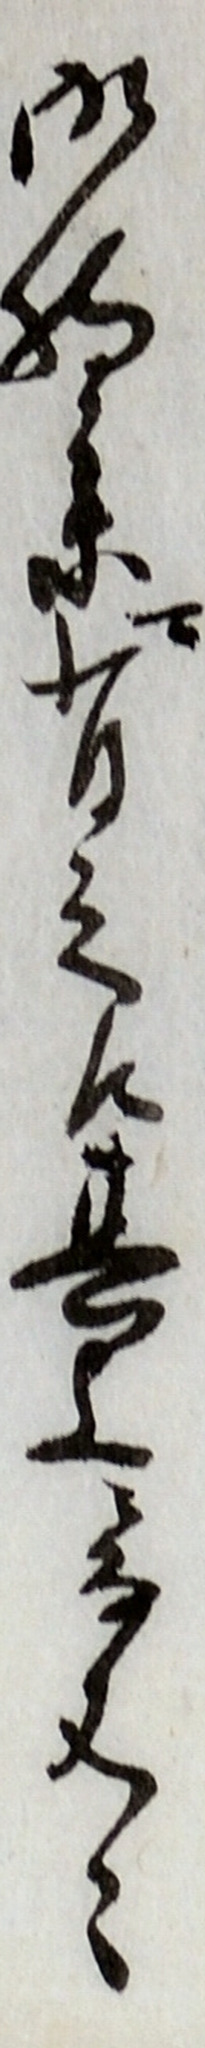御持参可有之候其上にて又々
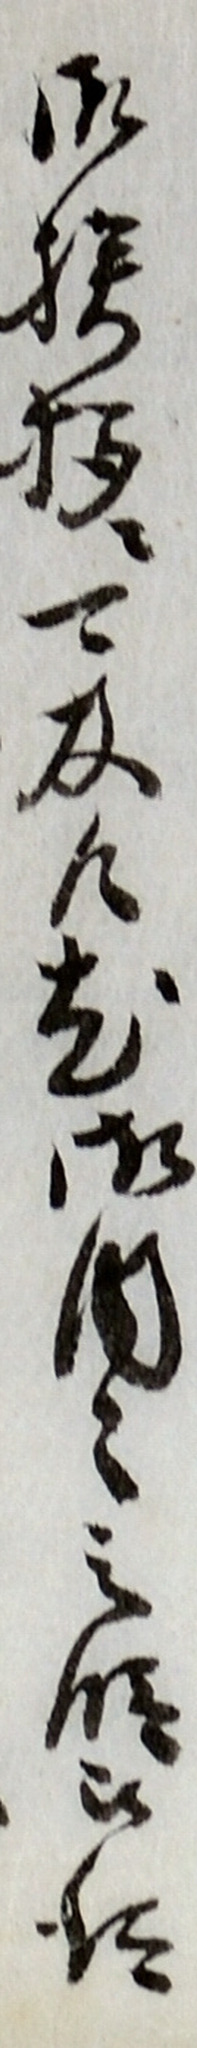御挨拶に可及候尤御内々之段被仰
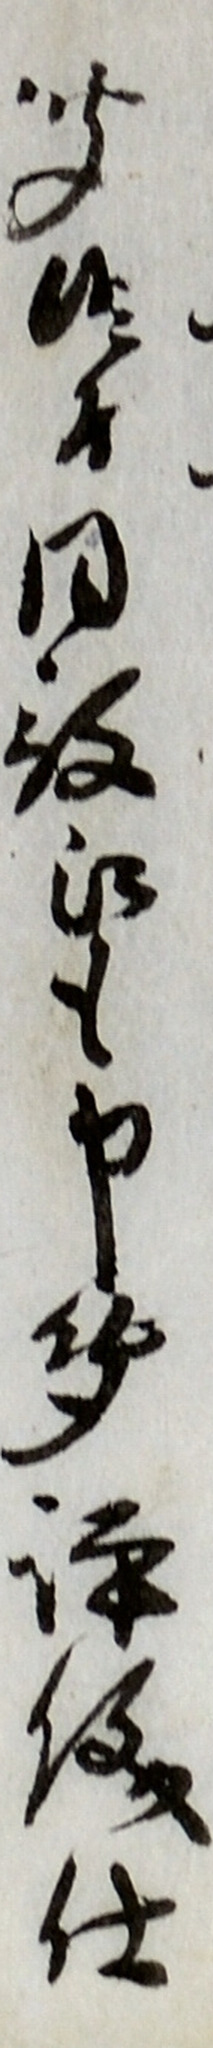聞候に付同役えも申聞評儀仕
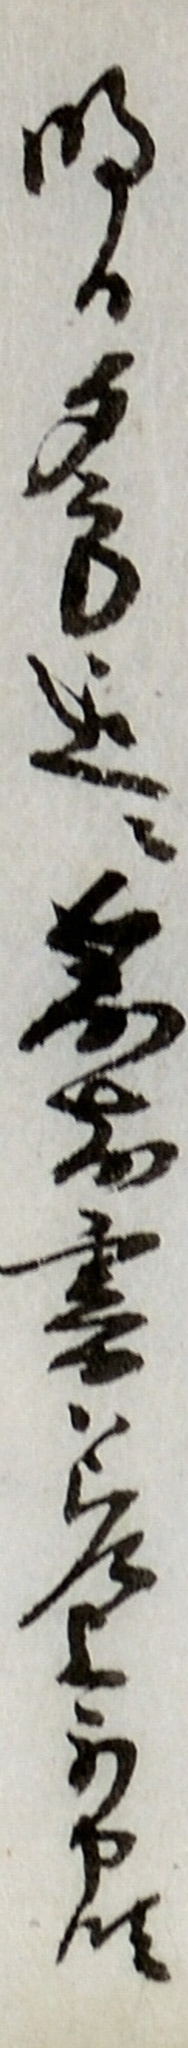明日夕方迄に名前書差上可申段
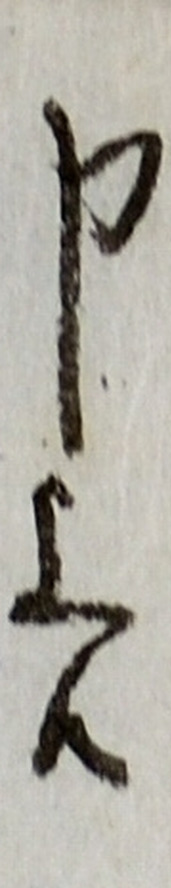申上候
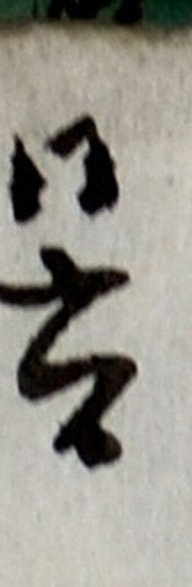同六日
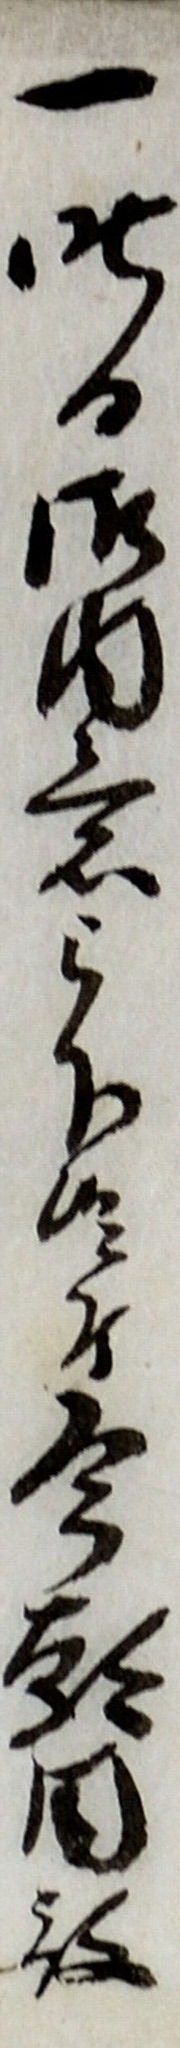一昨日御内意被下候に付今朝同役
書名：諸事御用留帳
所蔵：伊那市立高遠町図書館・合同会社AMANE
